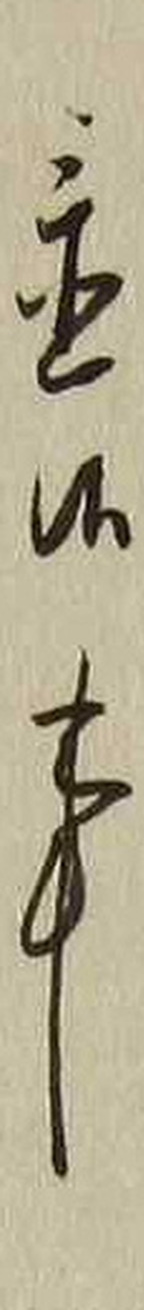置候事
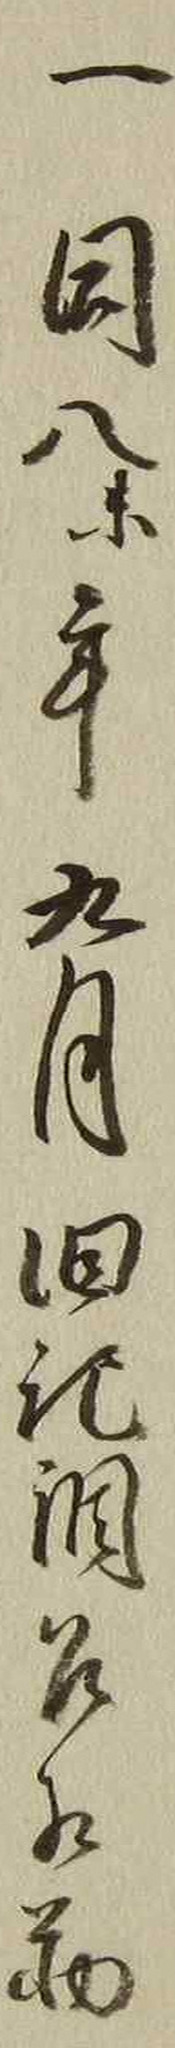一同八未年九月旧記調乍相勤
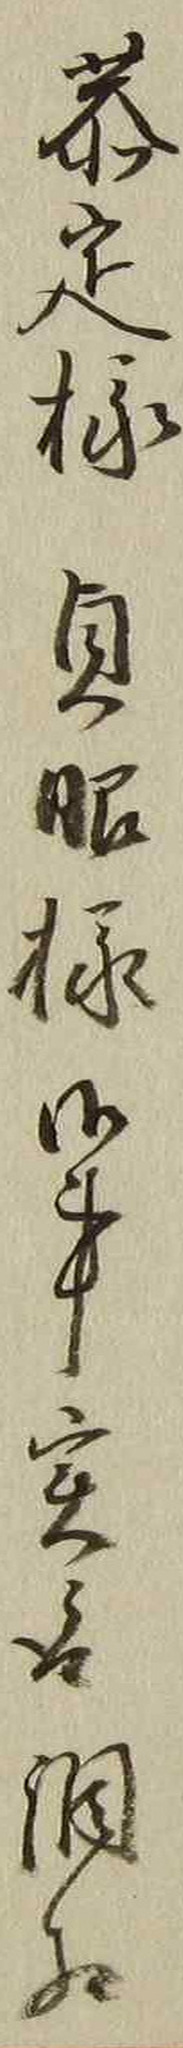恭定様貞昭様御事実取調相
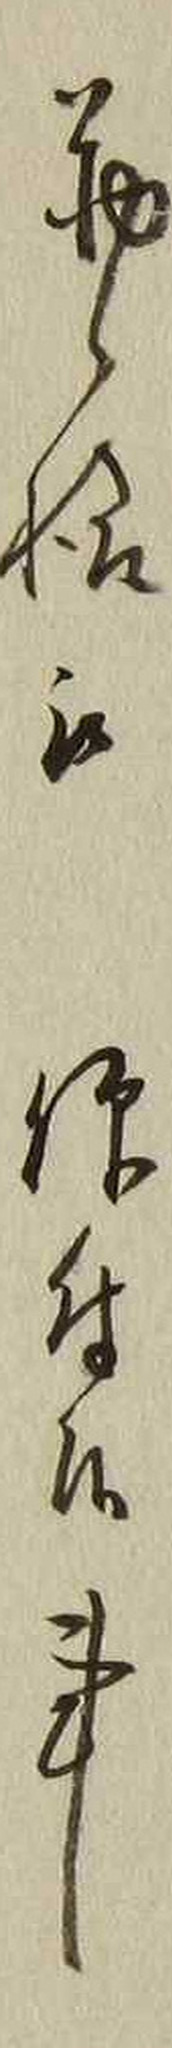勤候様被仰付候事
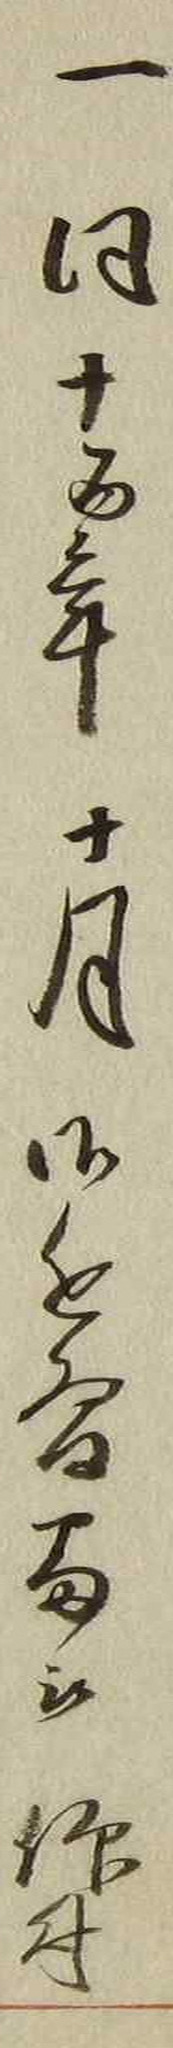一同十酉年十月御近習番被仰付
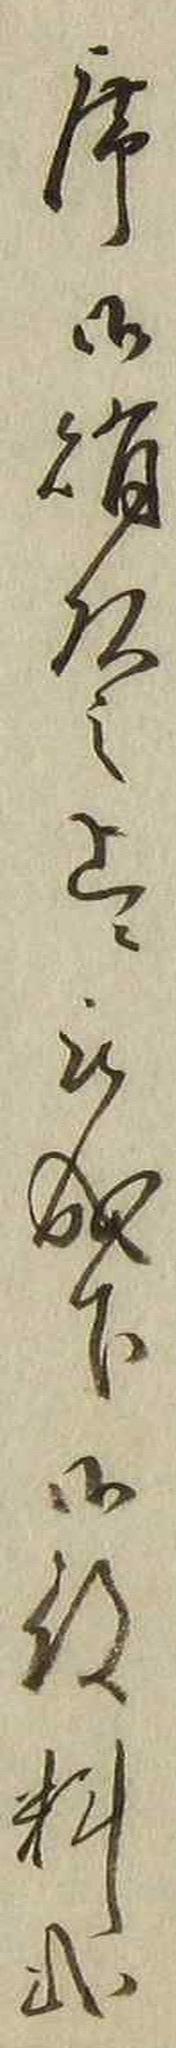席御賄頭之上ニ被成下御役料弐
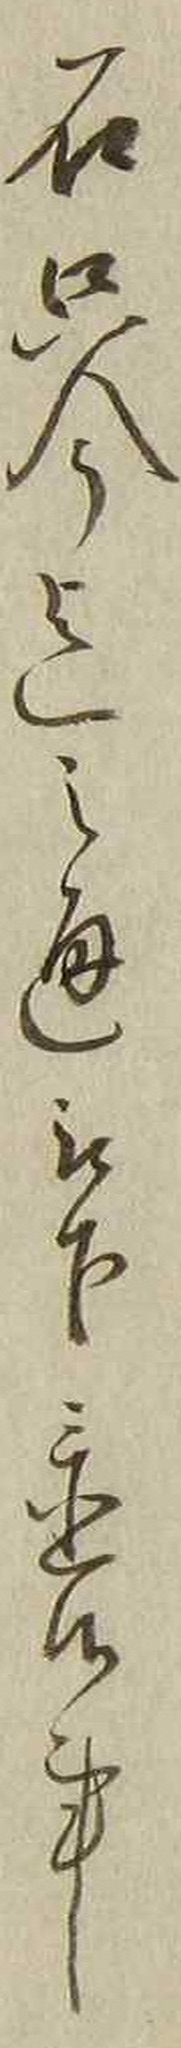石只今迄之通被下置候事
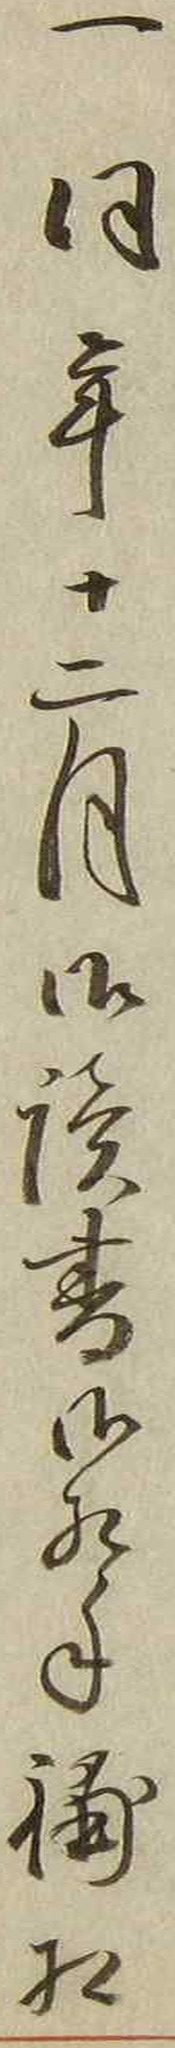一同年十二月御読書御相手補相

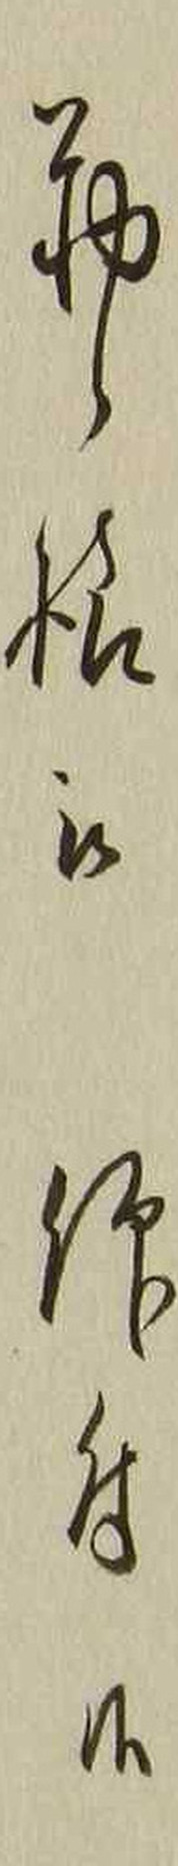勤候様被仰付候
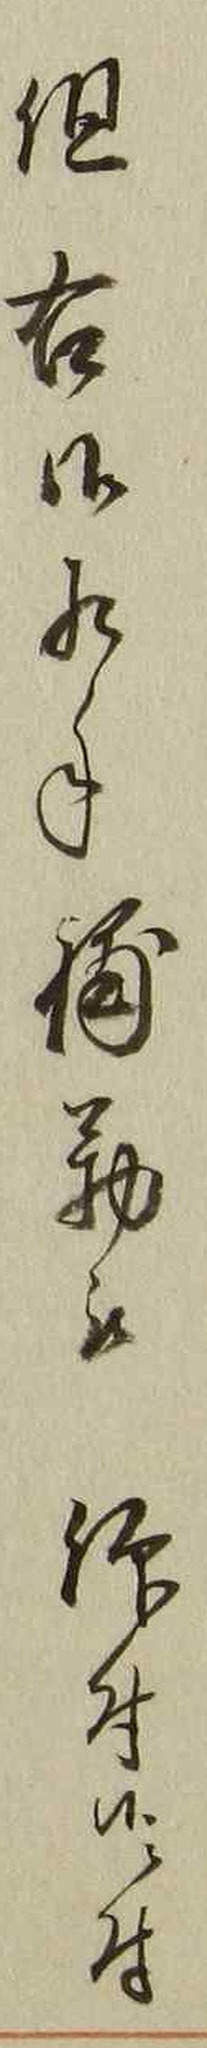但右御相手補勤被仰付候ニ付
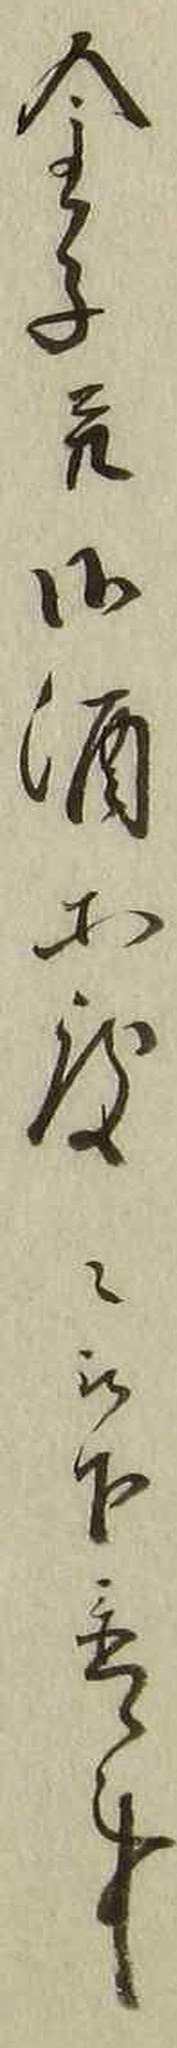金子幷御酒等度々被下置候事
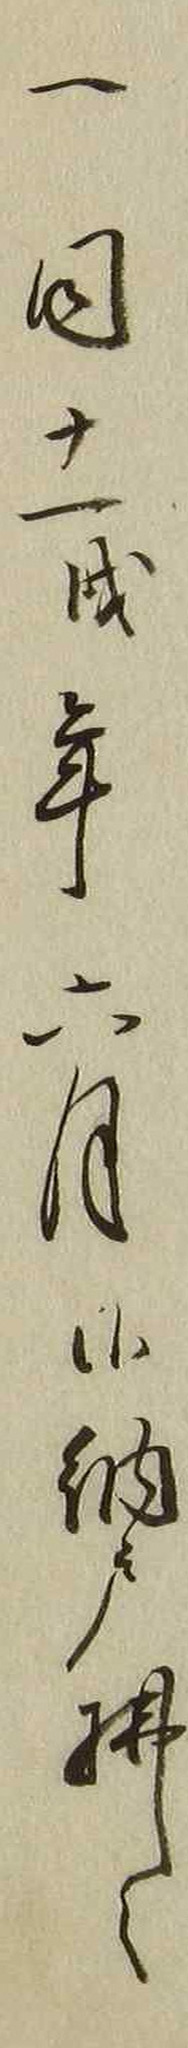一同十一戌年六月御納戸払之
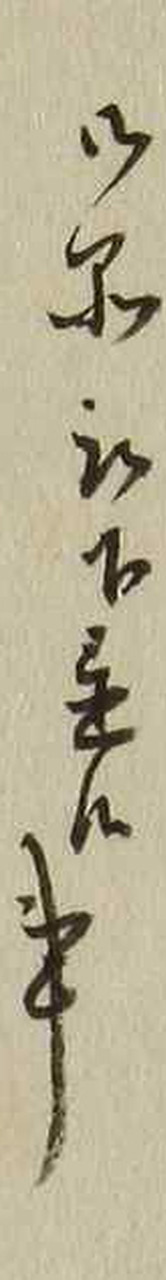御品被下置候事
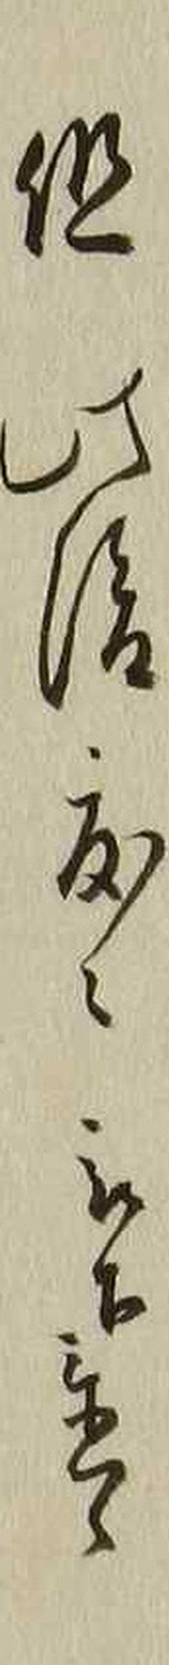但此後度々被下置候事
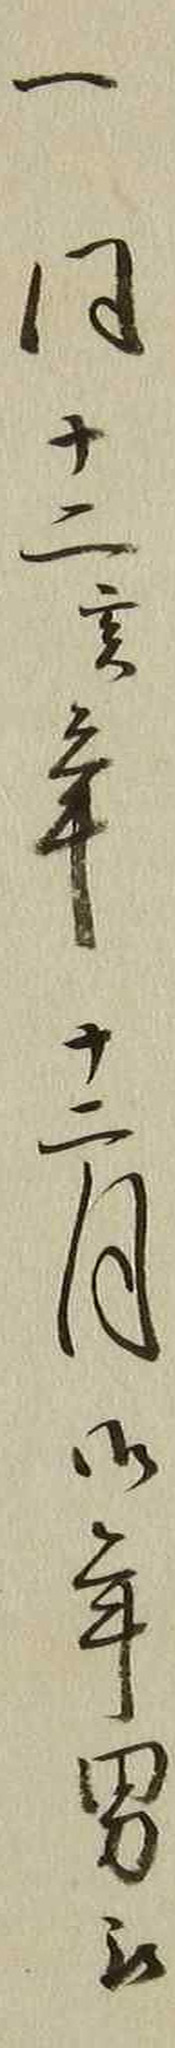一同十二亥年十二月御年男被
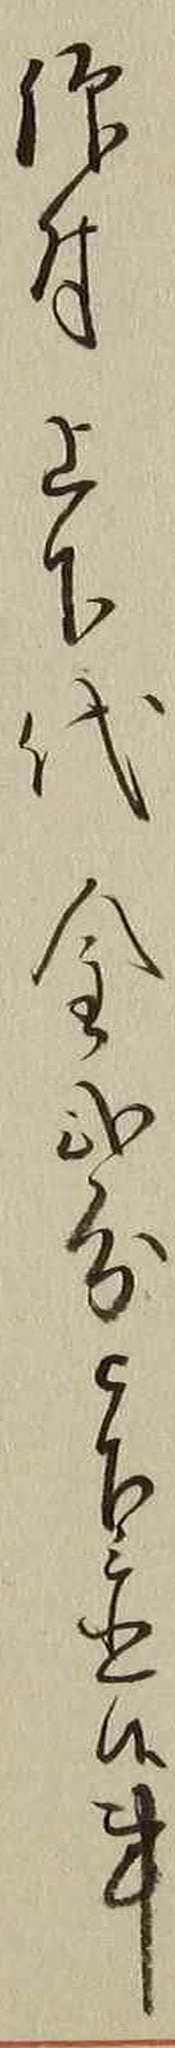仰付上下代金弐分被下置候事
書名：諸士系譜　巻之32　い之部32
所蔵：会津若松市立会津図書館
